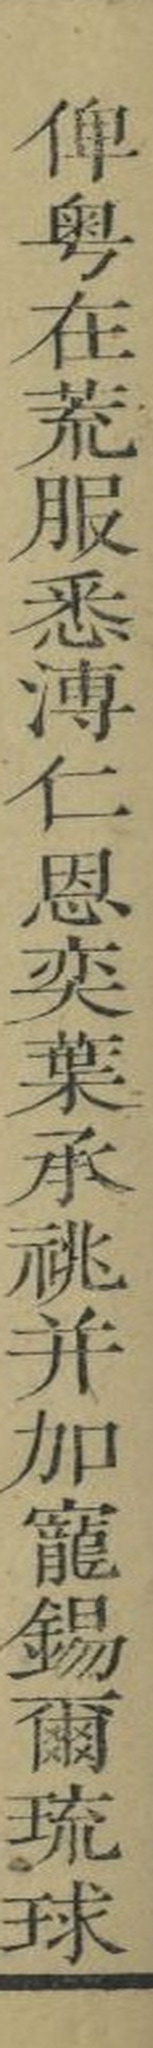俾粤在荒服悉溥仁恩奕葉承祧并加寵錫爾琉球
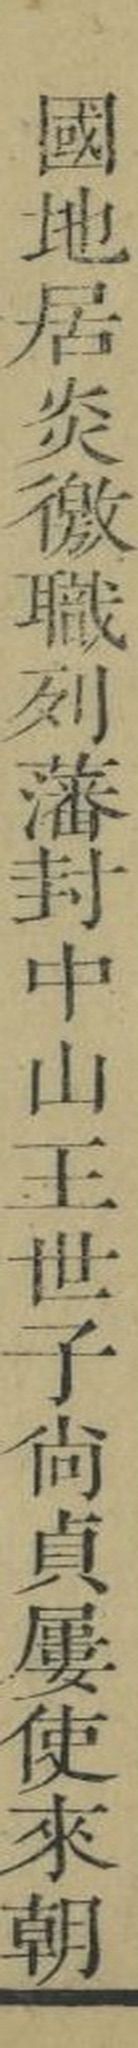国地居炎徼職列藩封中山王世子尚貞屢使来朝
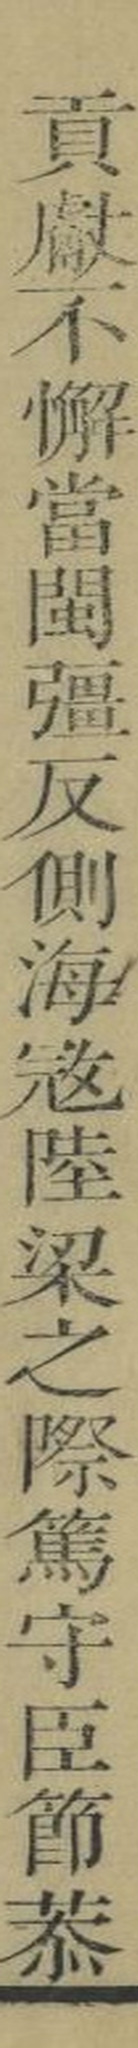貢献不懈当閩彊反側海寇陸梁之際篤守臣節恭
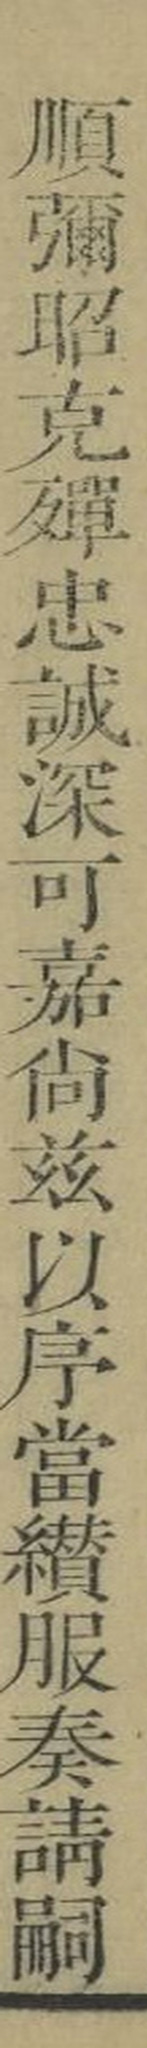順弥昭克殫忠誠深可嘉尚茲以序当纘服奏請嗣
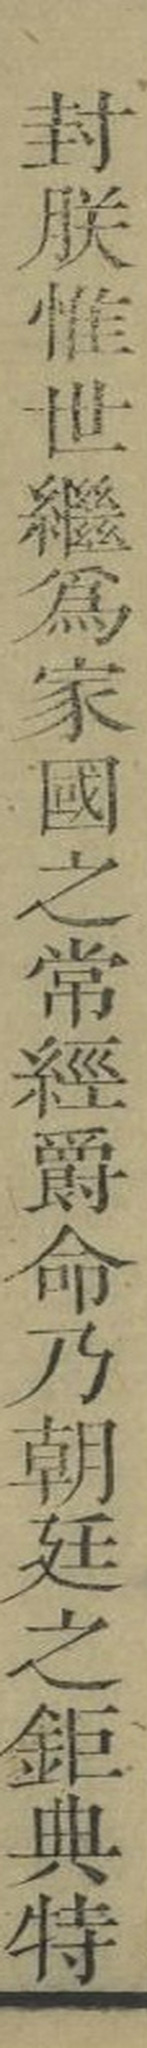封朕惟世継為家国之常経爵命乃朝廷之鉅典特
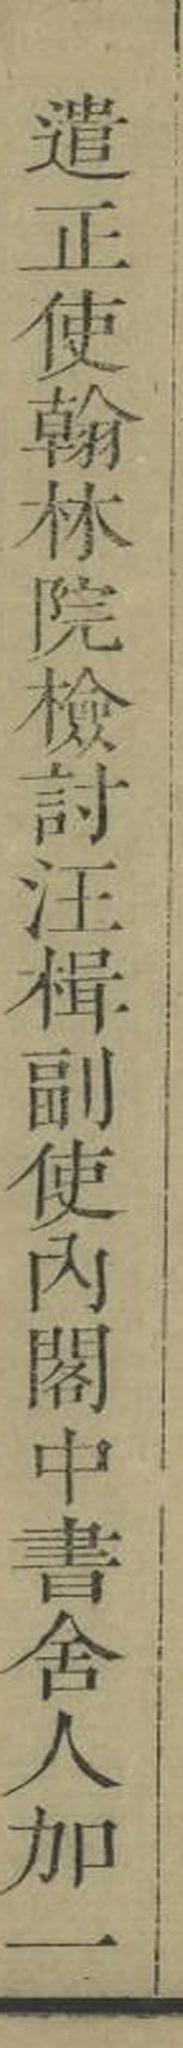遣正使翰林院検討汪楫副使内閣中書舎人加一
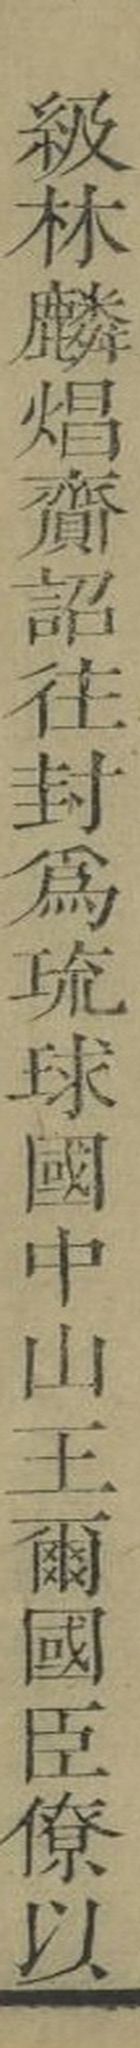級林麟焻齎詔往封為琉球国中山王爾国臣僚以
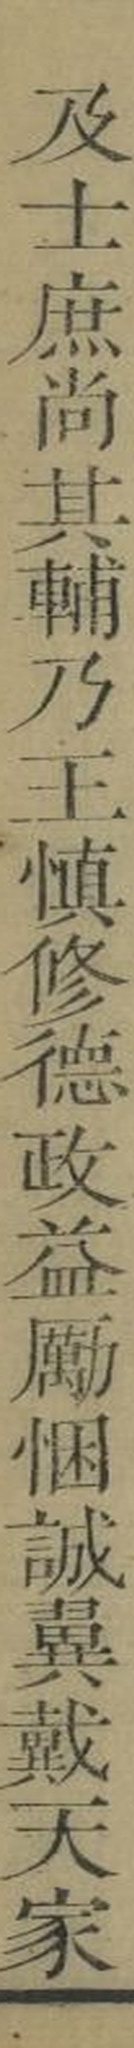及士庶尚其輔乃王慎修徳政益励悃誠翼戴天家

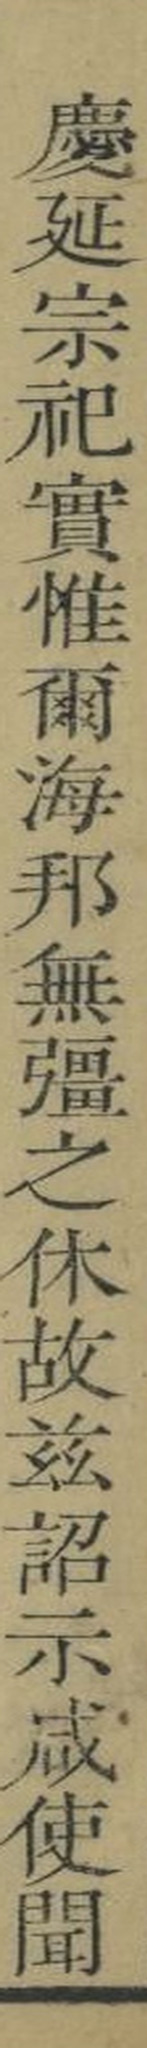慶延宗祀実惟爾海邦無彊之休故茲詔示咸使聞
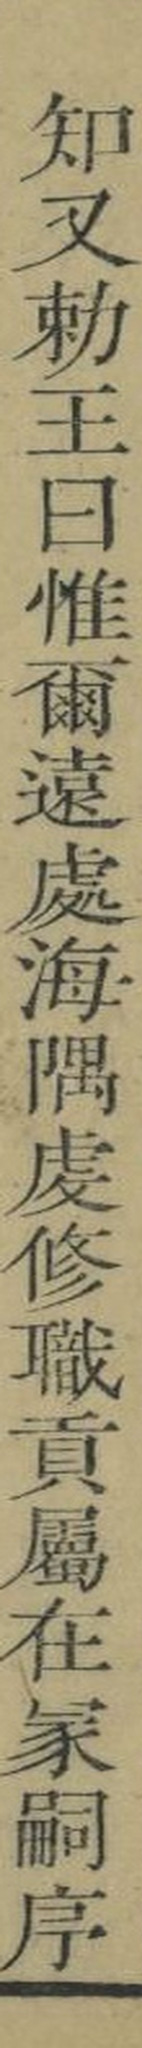知又勅王曰惟爾遠処海隅虔修職貢属在冡嗣序
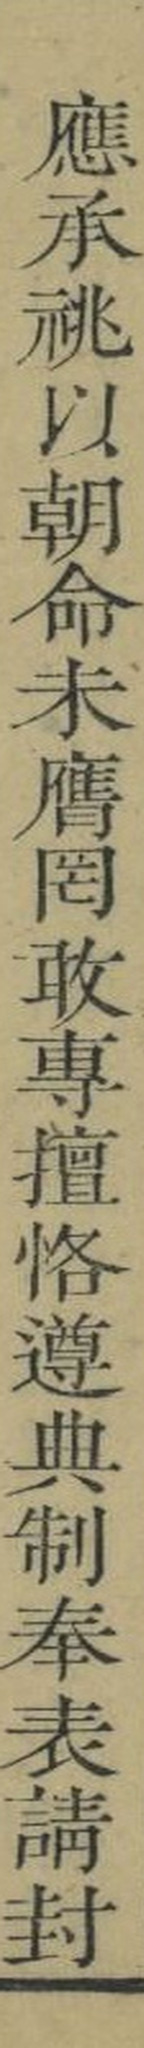応承祧以朝命未膺罔敢専擅恪遵典制奉表請封
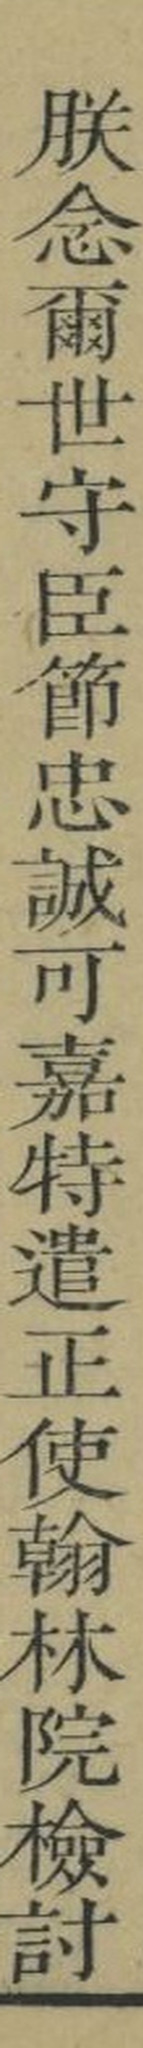朕念爾世守臣節忠誠可嘉特遣正使翰林院検討
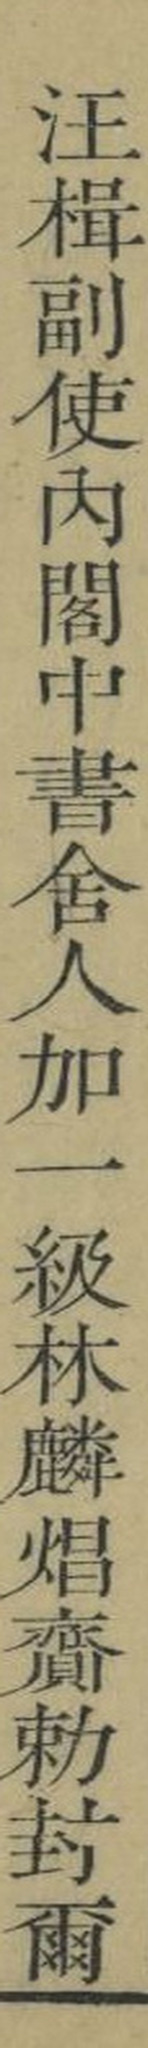汪楫副使内閣中書舎人加一級林麟焻齎勅封爾
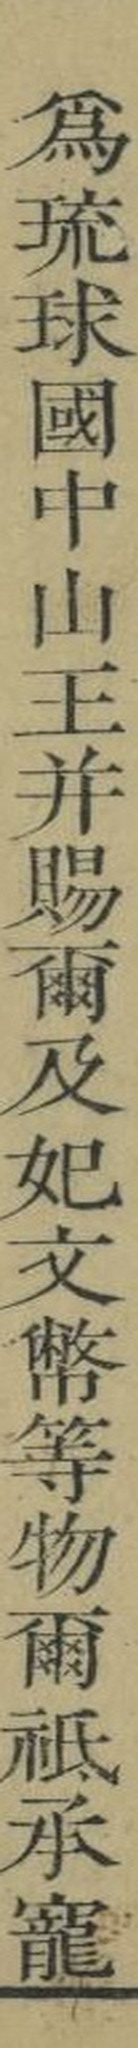為琉球国中山王并賜爾及妃文幣等物爾祇承寵
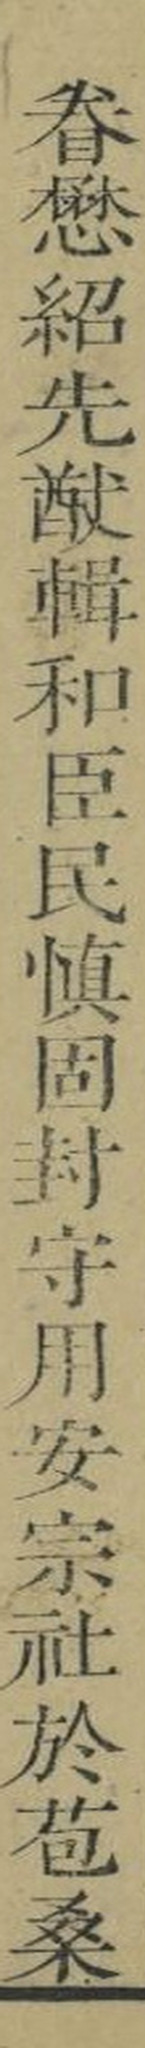眷懋紹先猷輯和臣民慎固封守用安宗社於苞桑
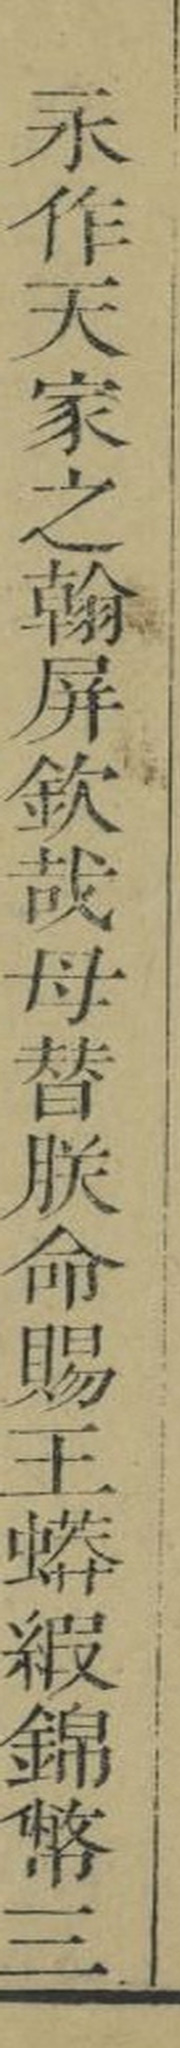永作天家之翰屏欽哉母替朕命賜王蟒緞錦幣三
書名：中山伝信録 巻三
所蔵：University of the Ryukyus Library
